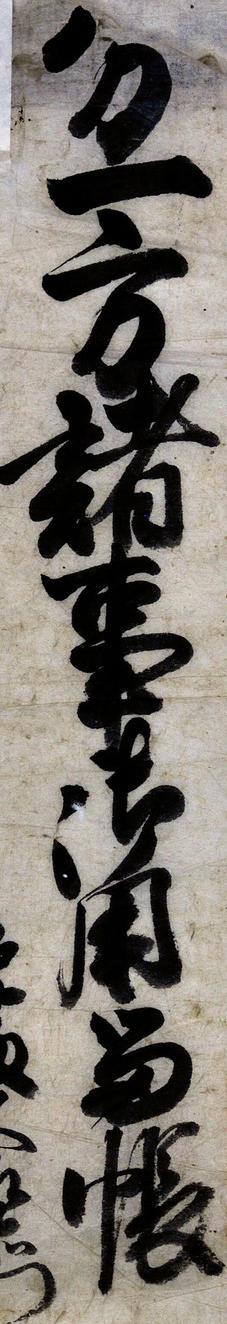分一方諸事御用留帳
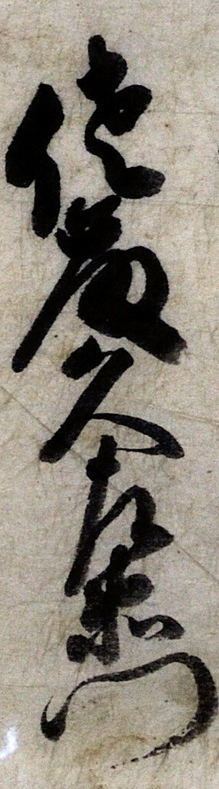佐藤久左衛門

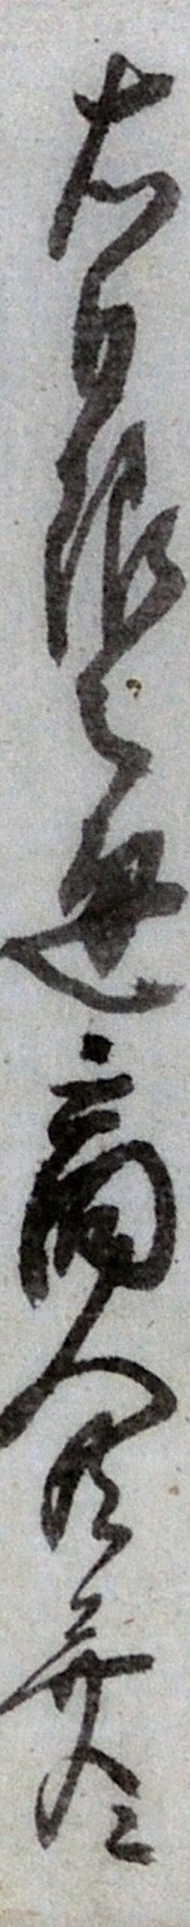右日限之通商人共并ニ
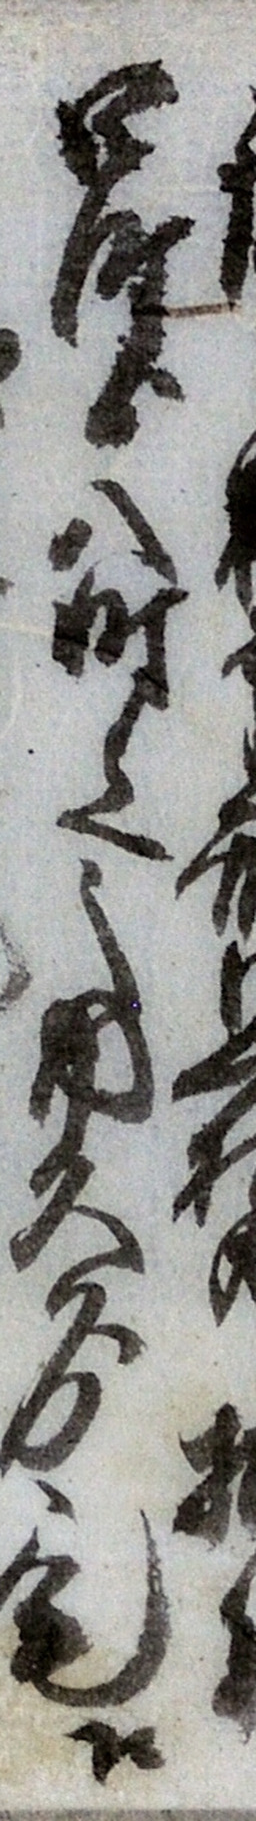四時ゟ八時迄之内久右衛門宅江
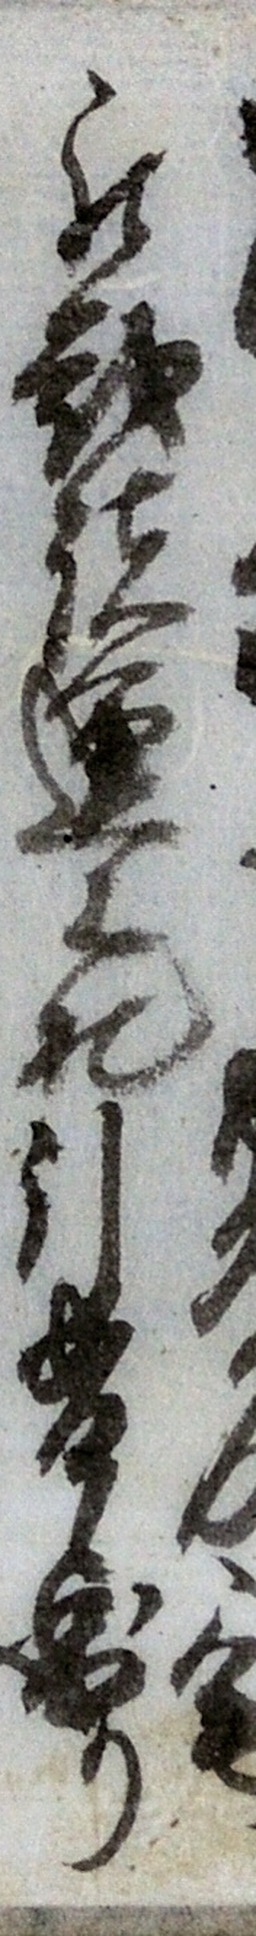罷越諸運上札引替図り
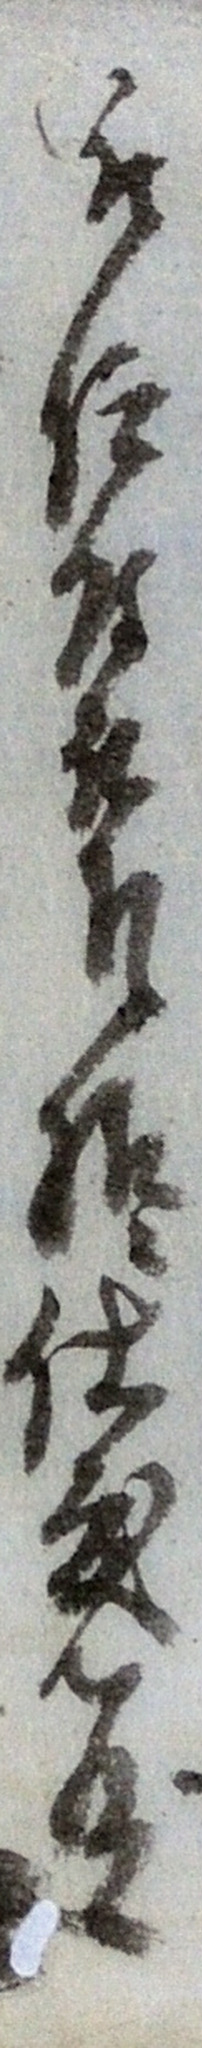被仰付被下候様仕度御座候
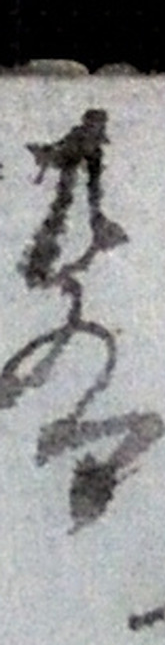廿九日
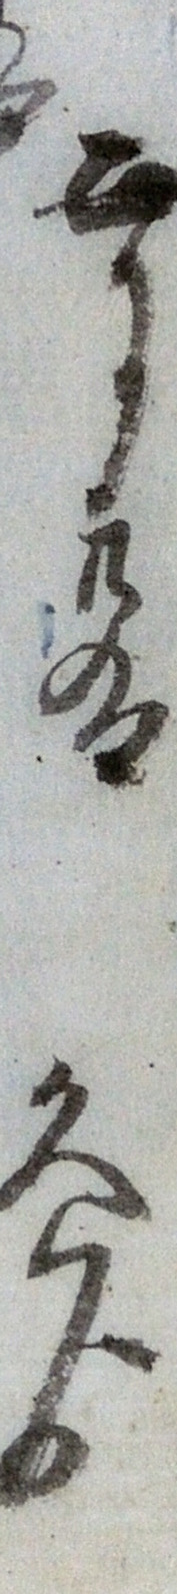正月廿九日久右衛門
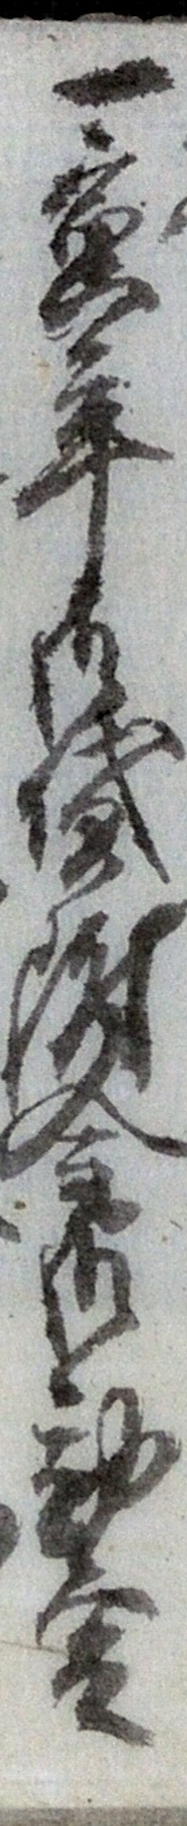一寅年御貸附金御勘定
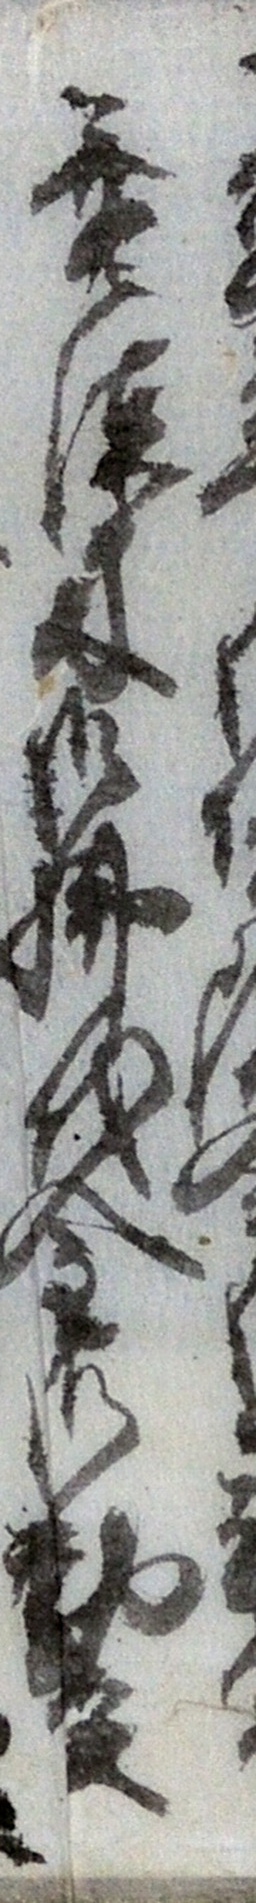并漆木御払代金御勘定
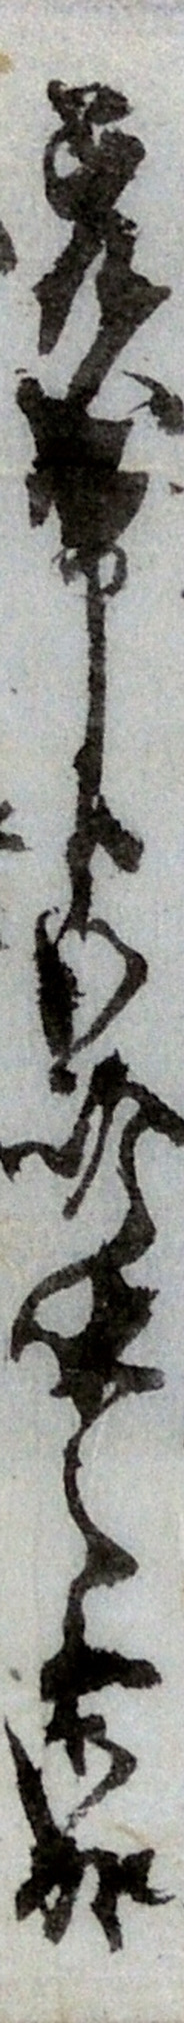差出申候御吟味之上御成
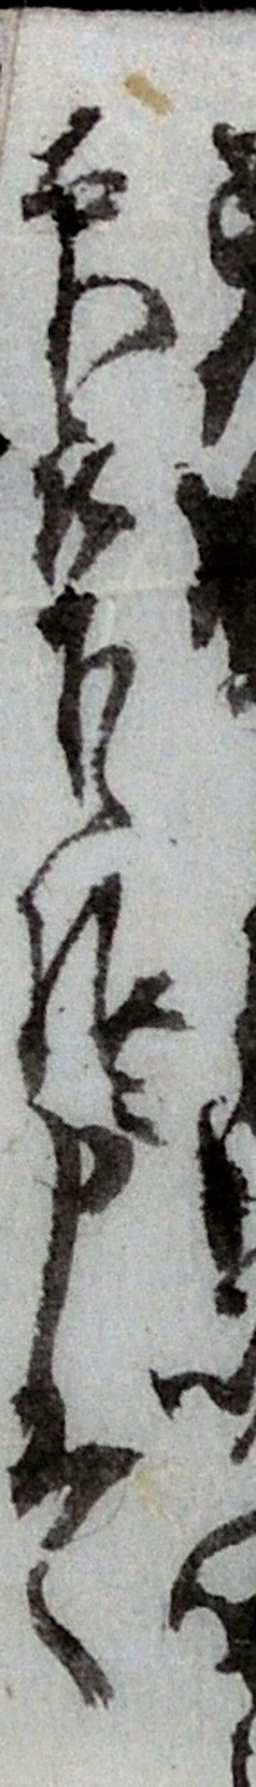印被下候様被申出候
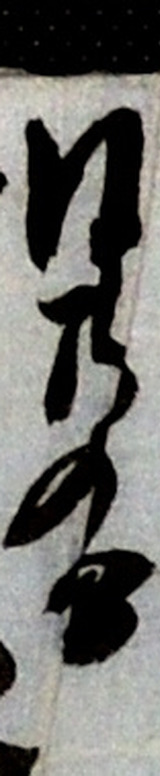同廿九日
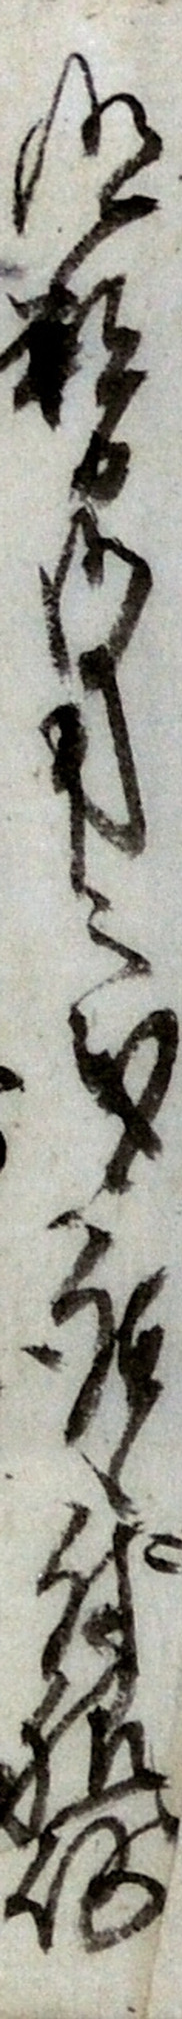明朝ゟ御用之義御座候付銀
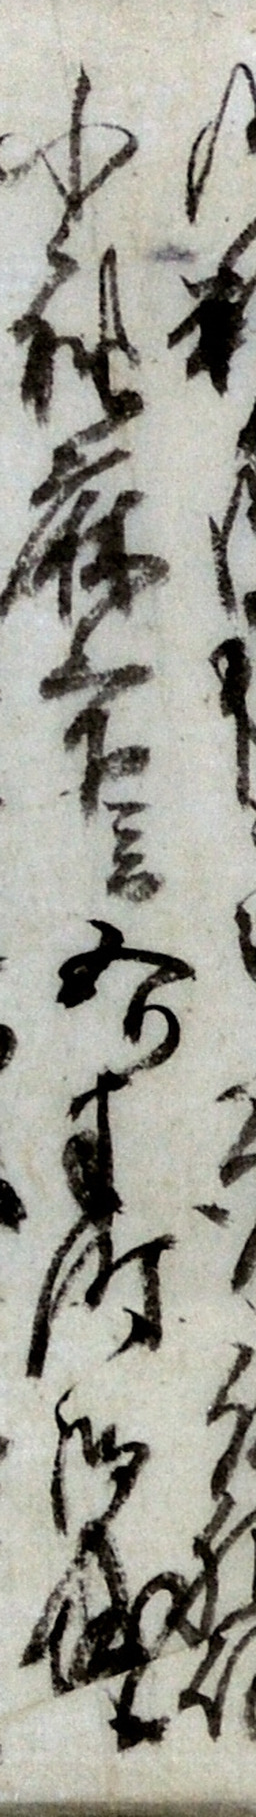小袖麻上下にて五ツ半時御城候
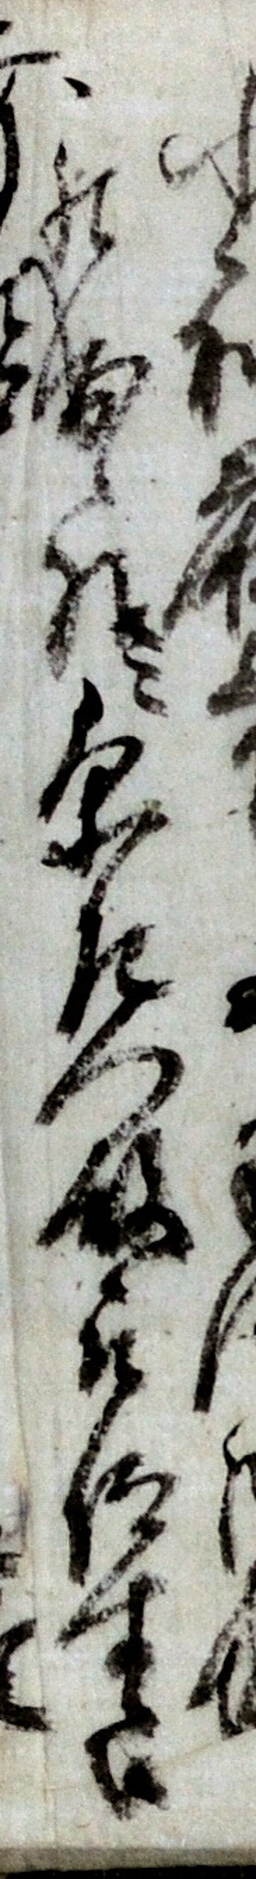罷出候様に原左衛門殿被仰付候
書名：分一方諸事御用留帳
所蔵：伊那市立高遠町図書館・合同会社AMANE
